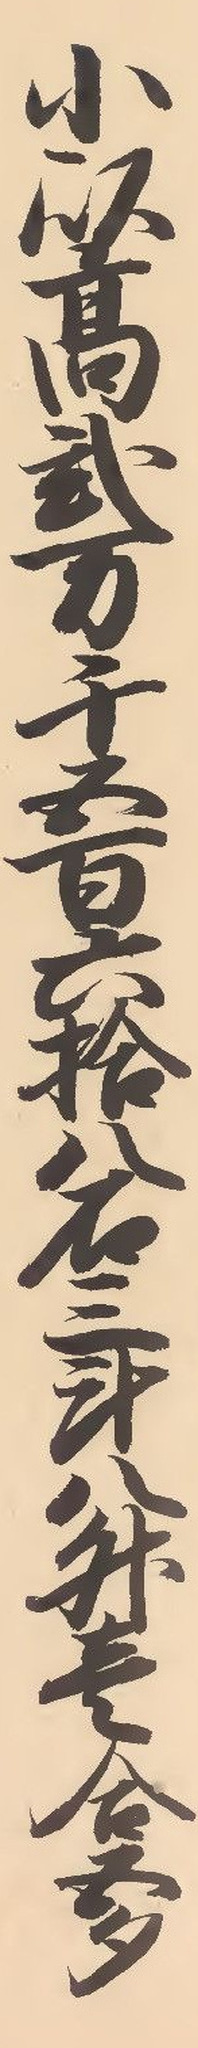小以高弐万千五百六拾八石三斗八升壱合五勺

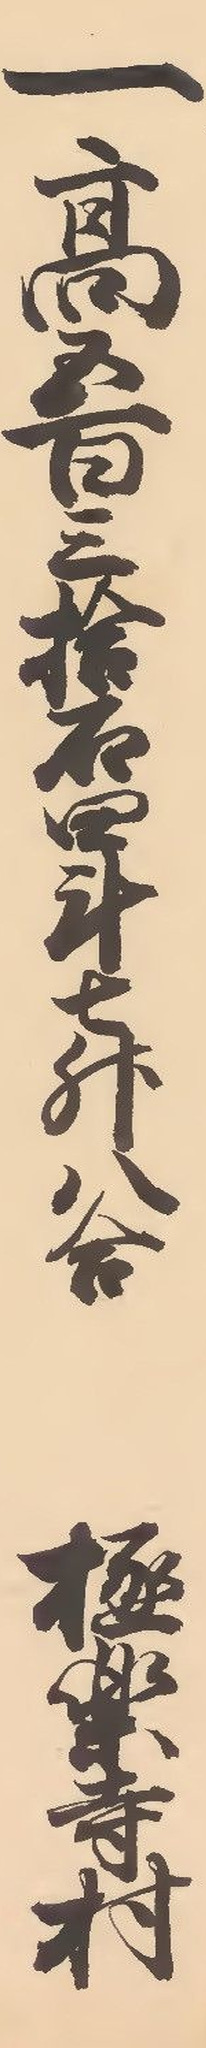一高五百三拾石四斗七升八合極楽寺村
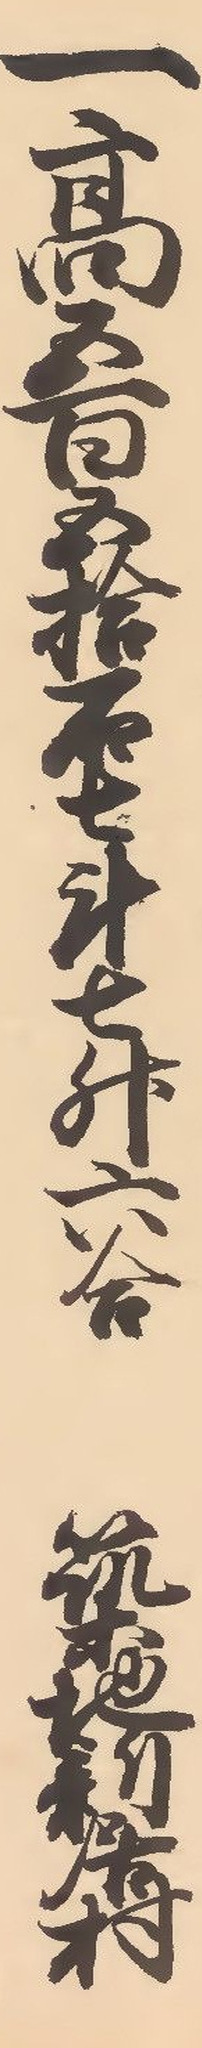一高五百五拾石七斗七升六合築地新居村
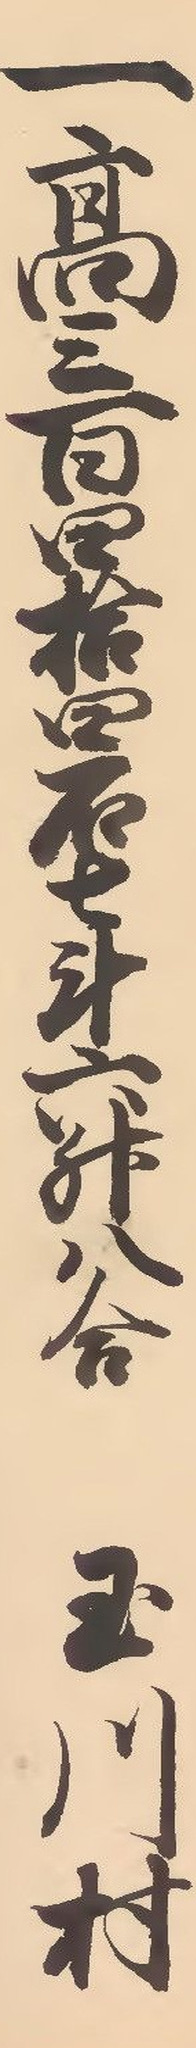一高三百四拾四石七斗六升八合玉川村
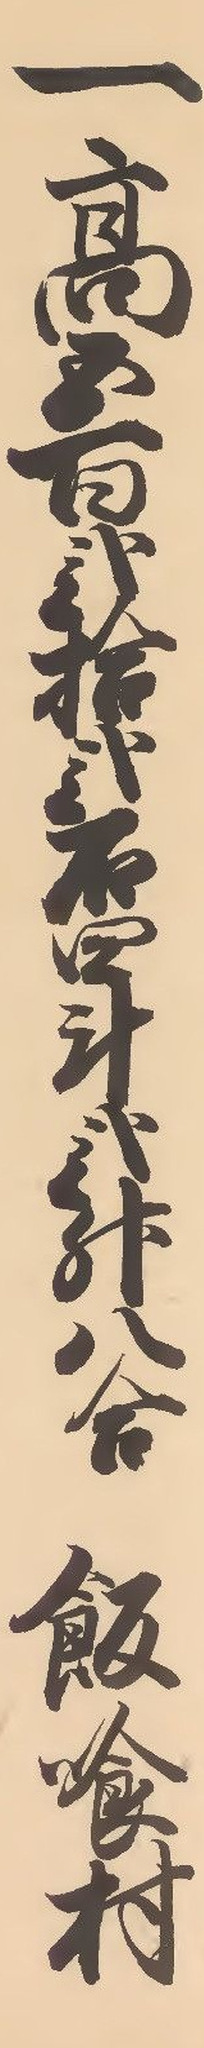一高五百弐拾弐石四斗弐升八合飯喰村
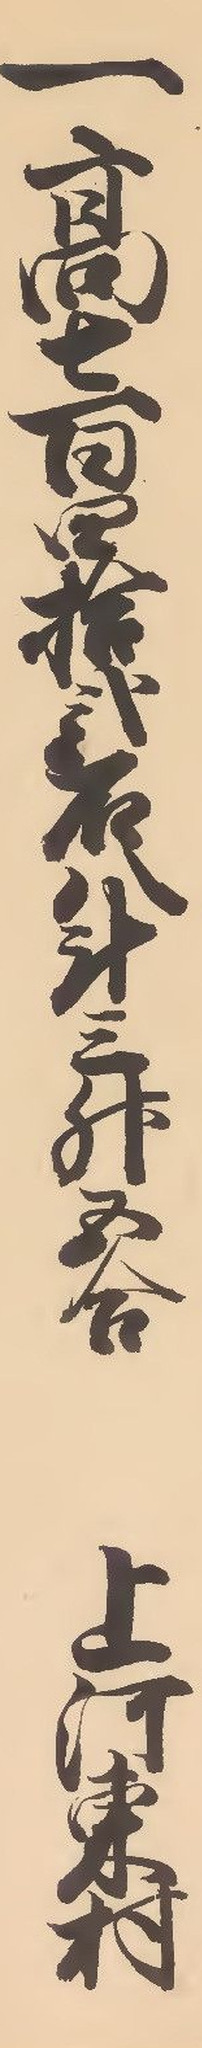一高七百四拾弐石八斗三升五合上河東村
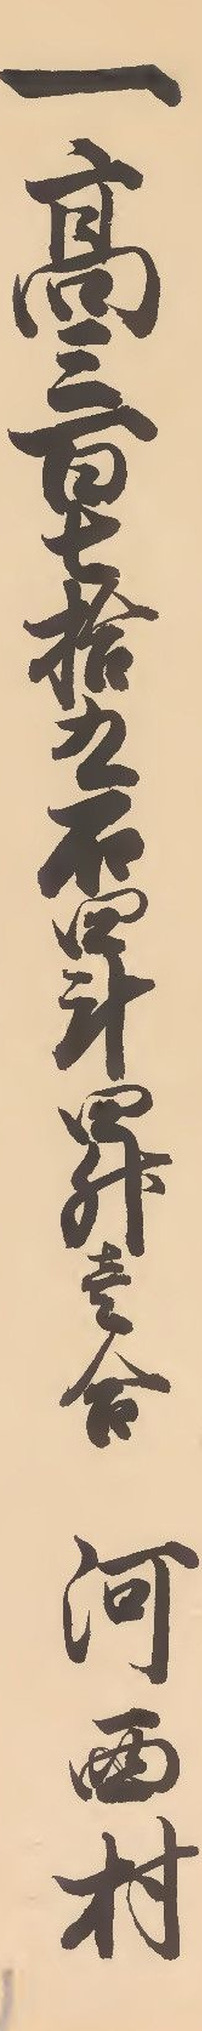一高三百七拾九石四斗四升壱合河西村
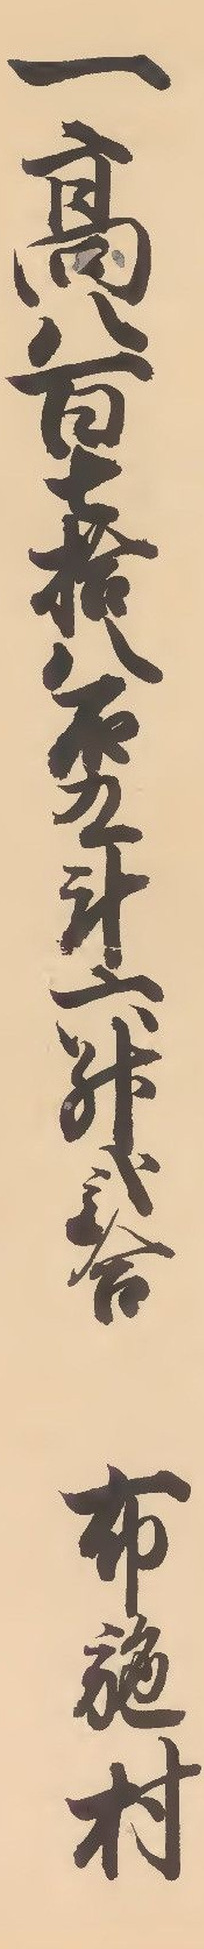一高八百七拾八石九斗六升弐合布施村

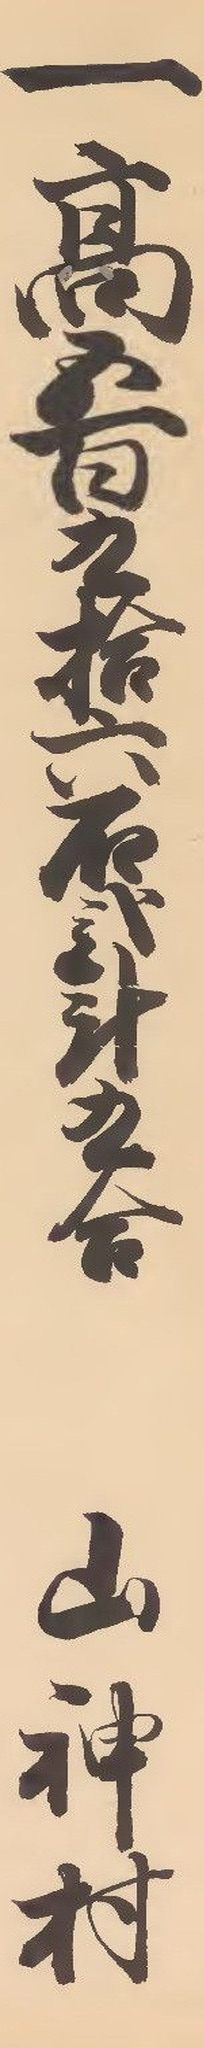一高五百九拾六石弐斗九合山神村
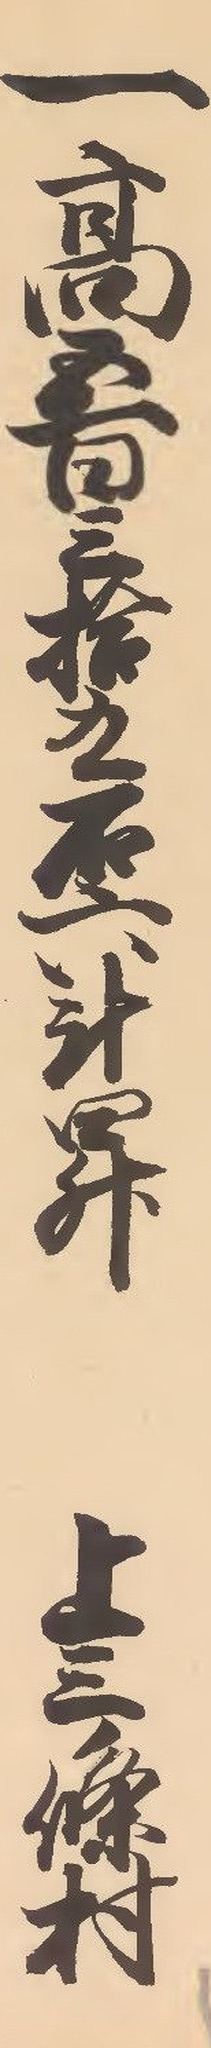一高五百三拾九石六斗四升上三ノ条村
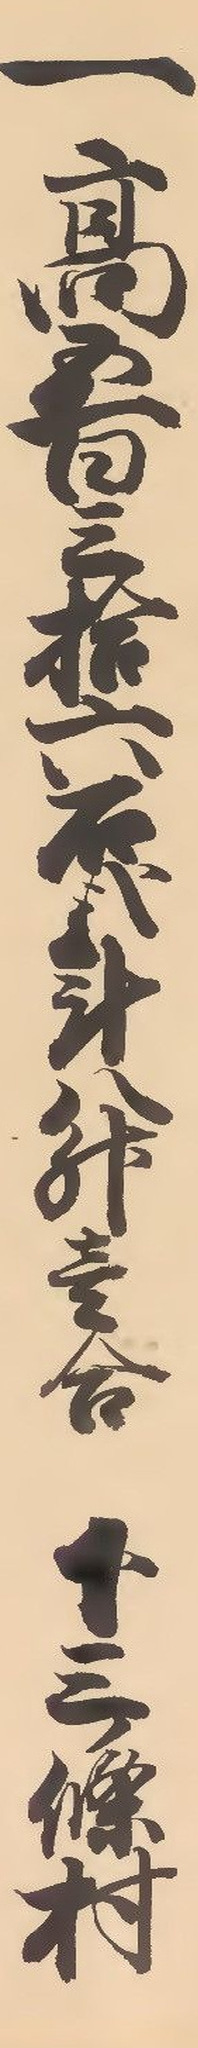一高五百三拾六石弐斗八升壱合下三ノ条村
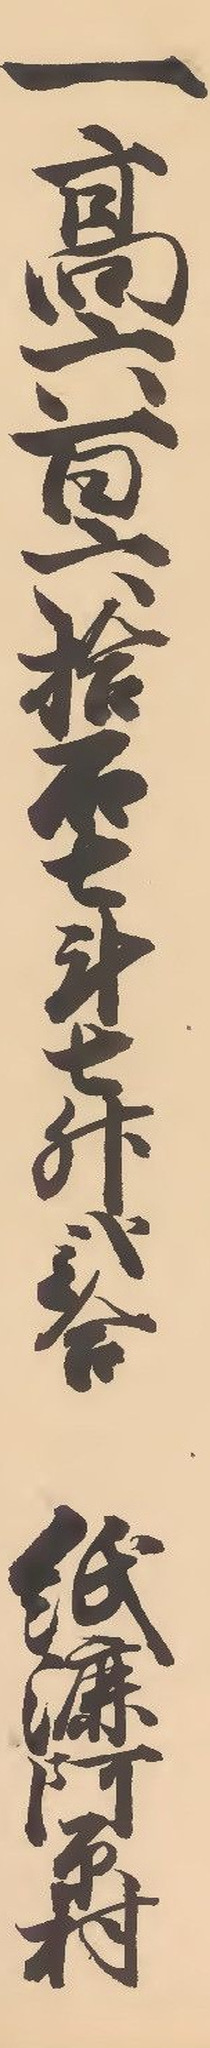一高六百六拾石七斗七升弐合紙漉阿原村
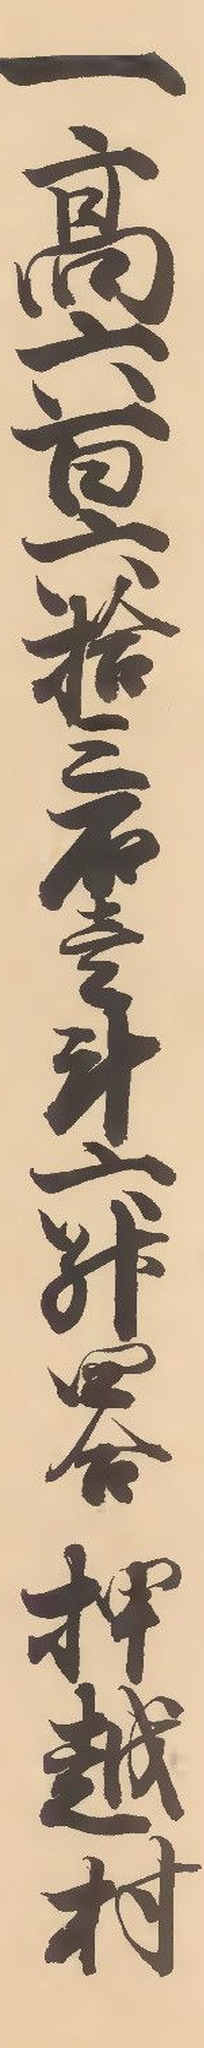一高六百六拾三石壱斗六升四合押越村
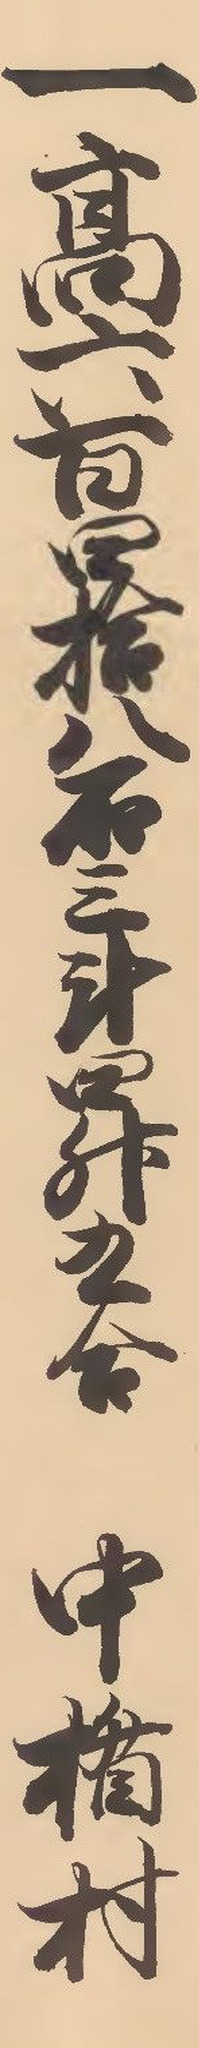一高六百四拾八石三斗四升九合中楯村
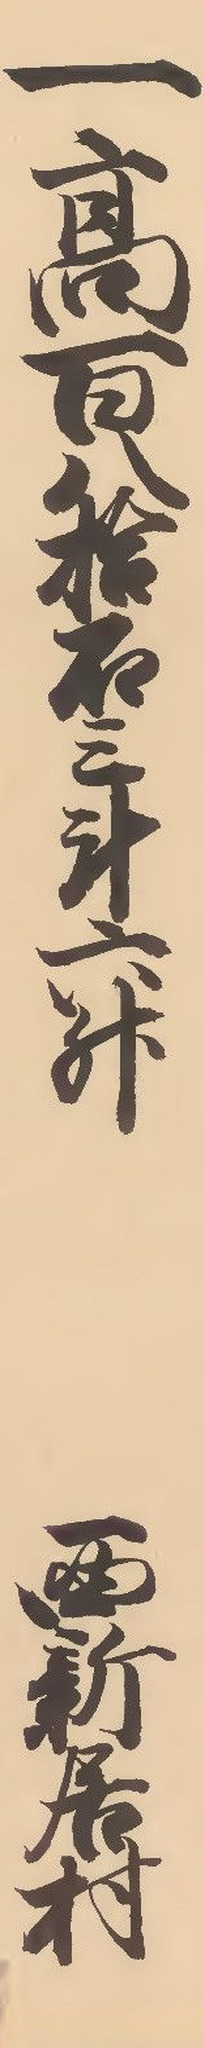一高百八拾石三斗六升西新居村
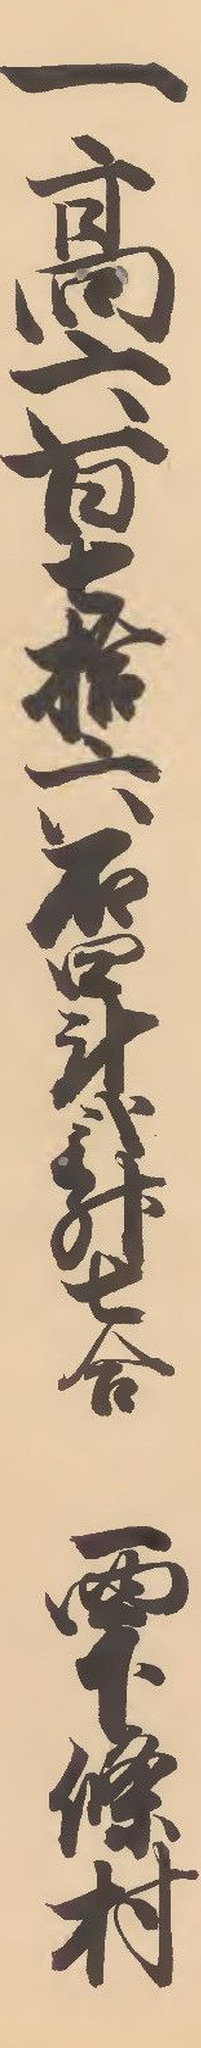一高六百七拾六石四斗弐升七合西下条村
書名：甲斐国郷帳
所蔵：国立公文書館 National Archives of Japan
